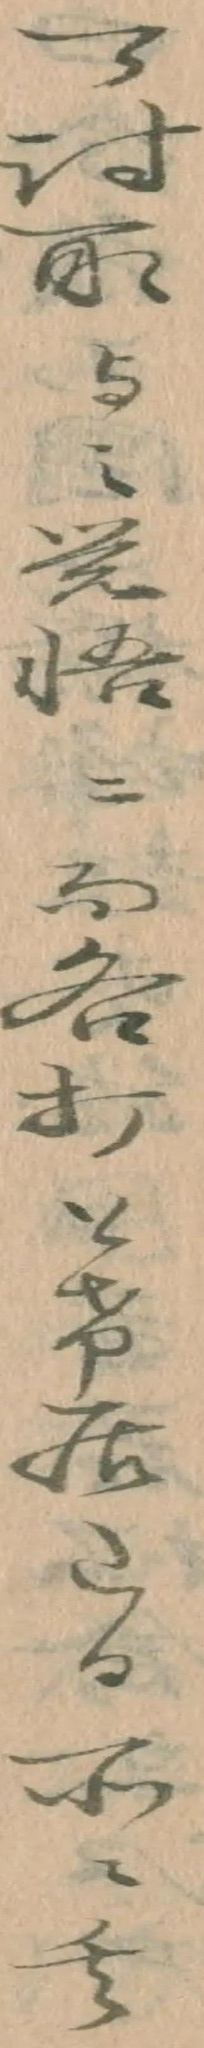可討取与之覚悟に而各打とけ居たる所々其
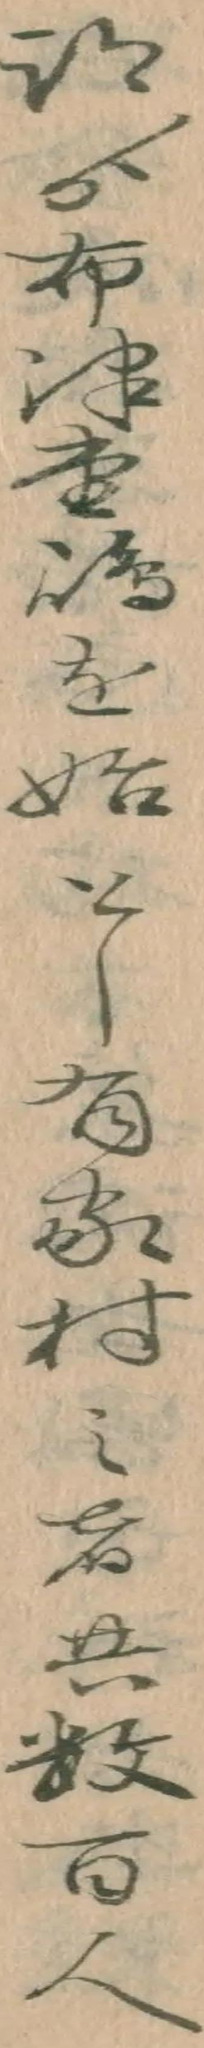跡ゟ布津堂島を始とし有家村之者共数百人
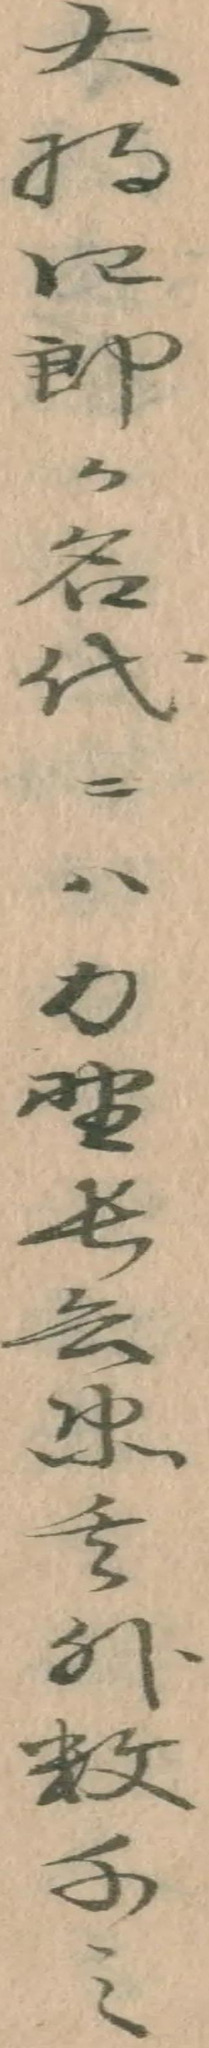大将四郎か名代には力野長兵衛其外数千之
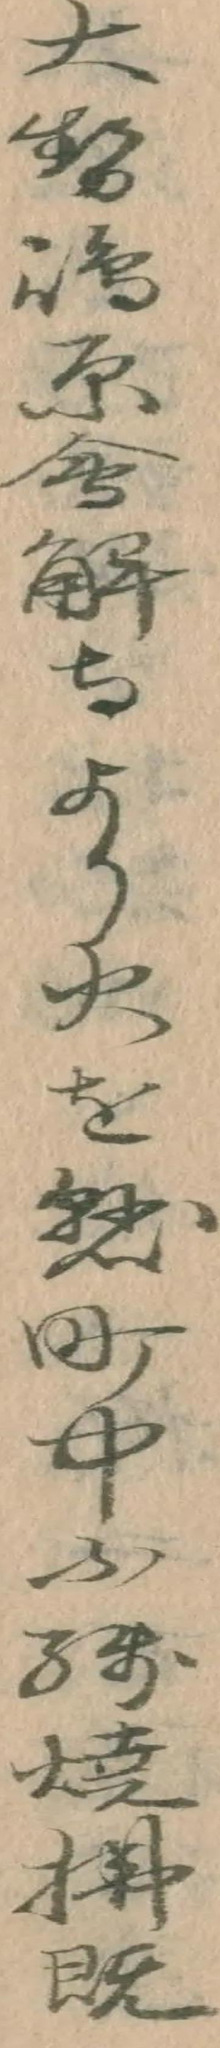大勢島原会解寺より火を懸町中不残焼払既
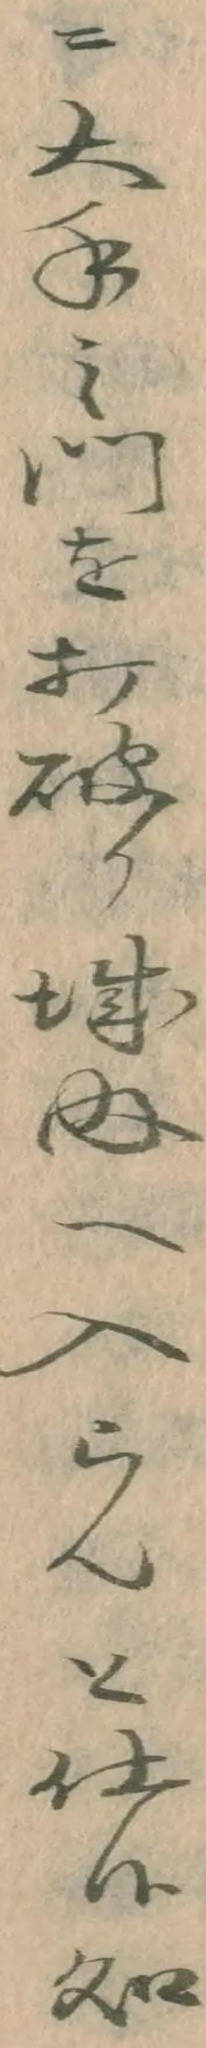に大手之門を打破り城内へ入らんと仕候処
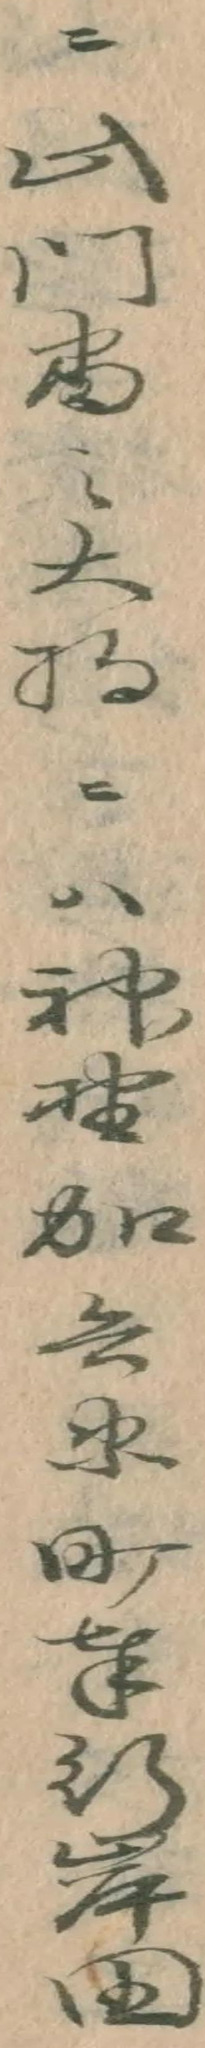に此門番之大将には神野加兵衛町奉行岸田
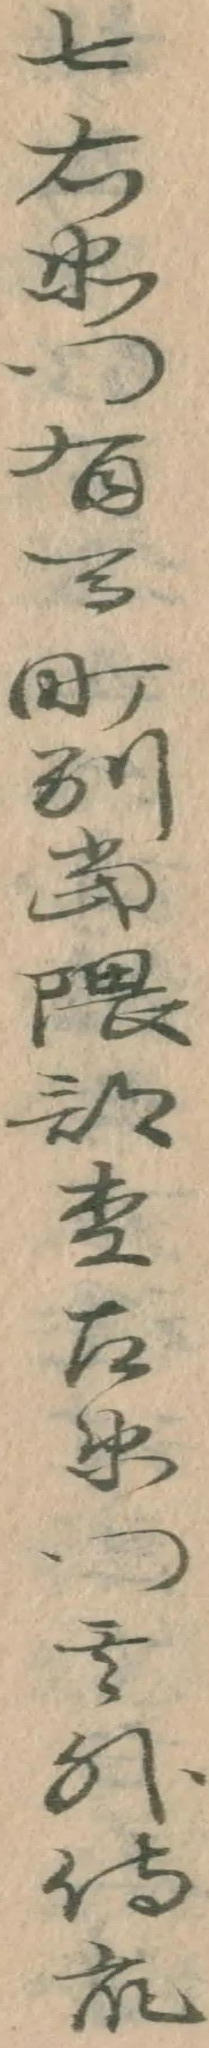七右衛門有馬町別当隅部杢左衛門其外侍衆
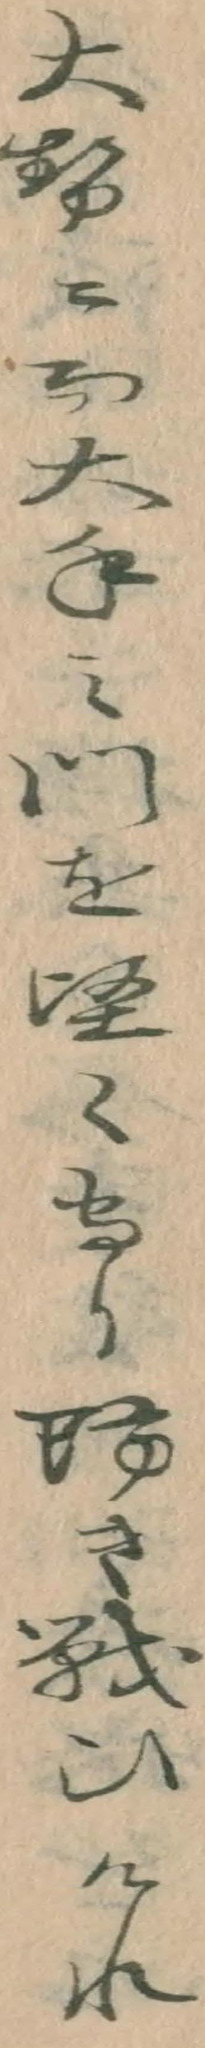大勢に而大手之門を堅く守り防き戦ひけれ
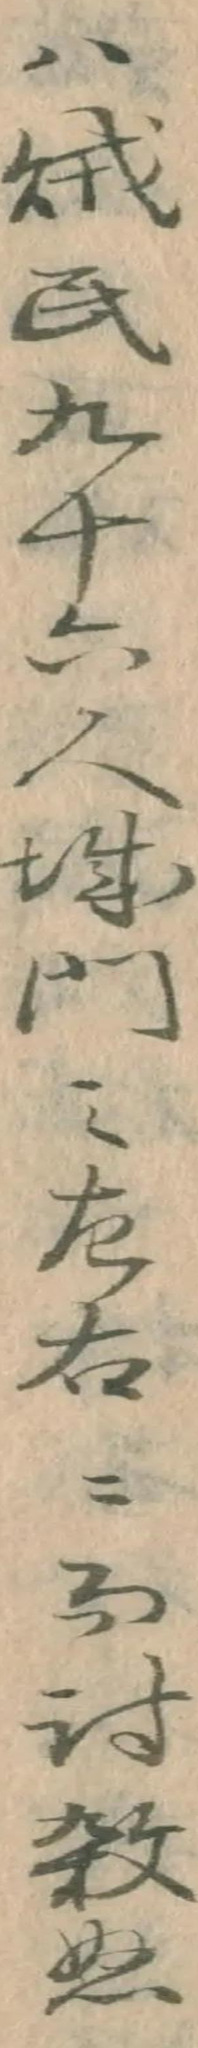は賊民九十六人城内之左右に而討殺ぬ
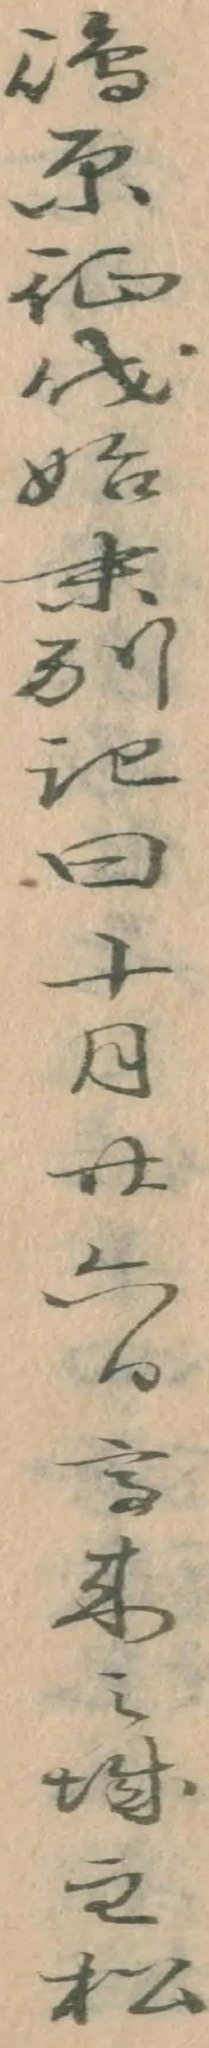島原征伐始末別記日十月廿六日高来之城主松

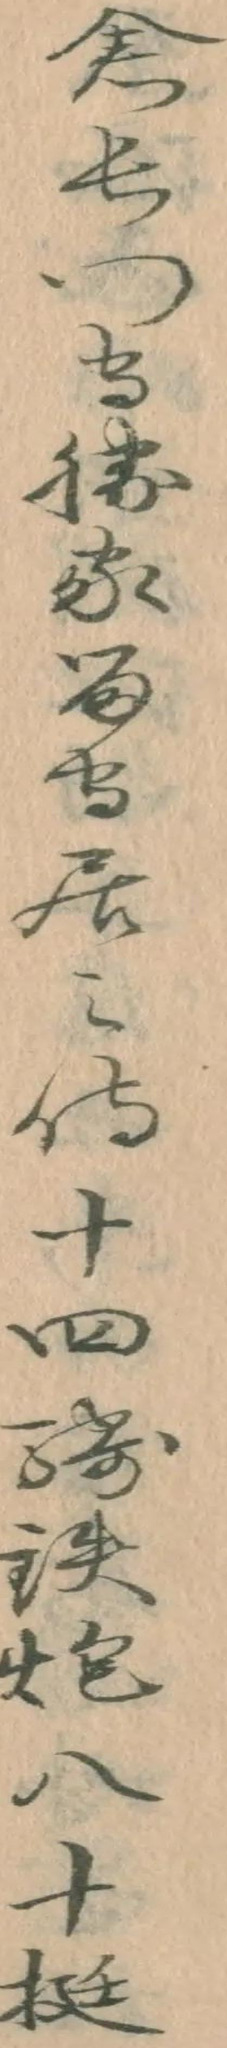倉長門守勝家留守居之侍十四騎鉄炮八十挺
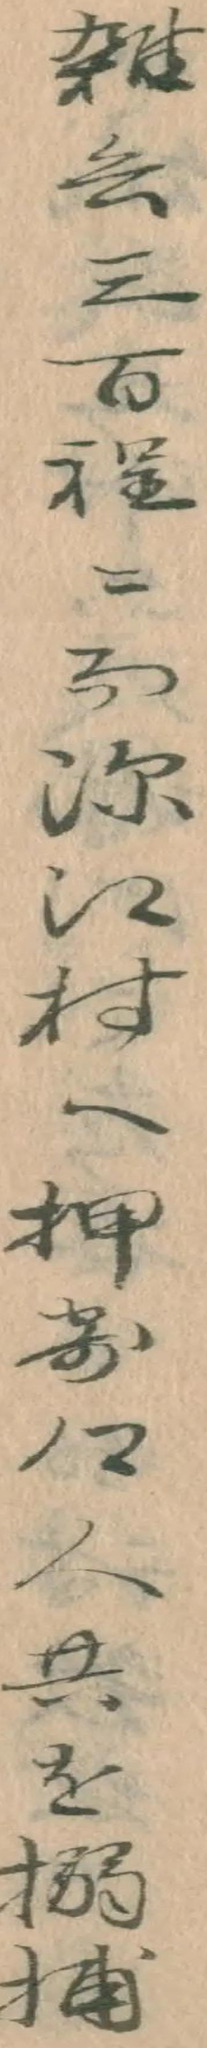雑兵三百程に而深江村へ押寄郷人共を搦捕
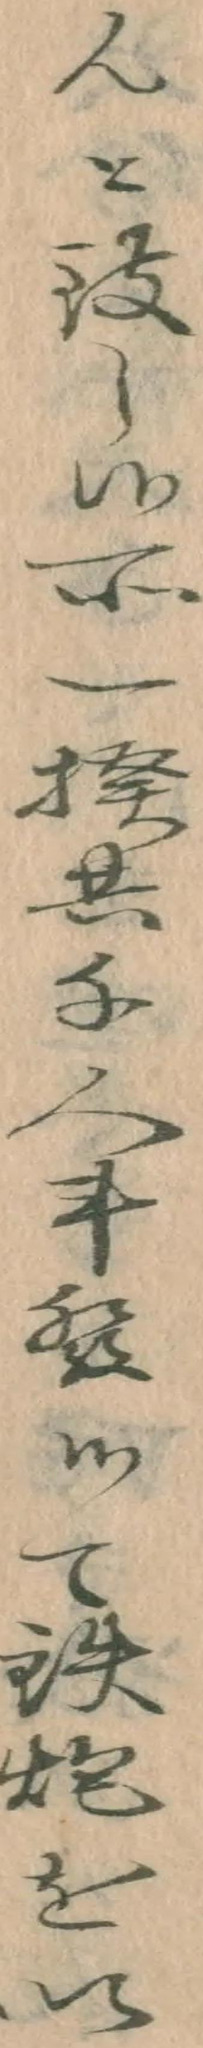んと致し候所一揆共千人斗発候て鉄炮を以
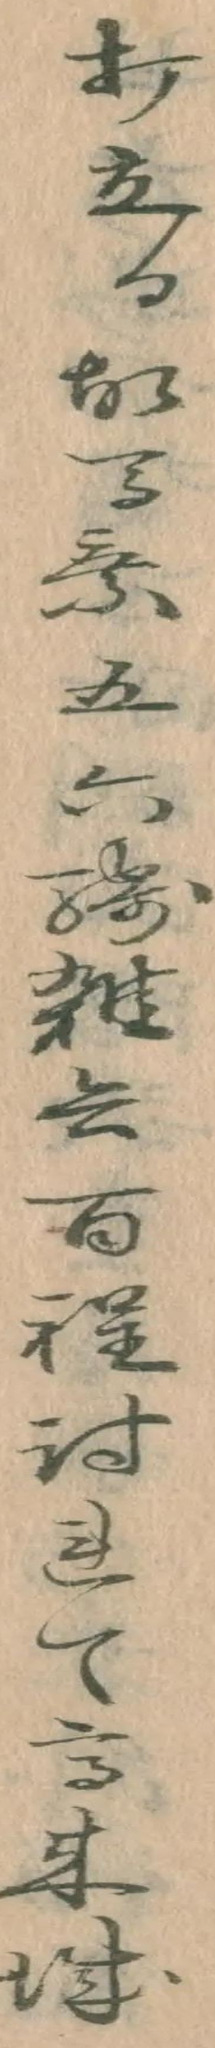打立る故馬乗五六騎雑兵百程討れて高来城
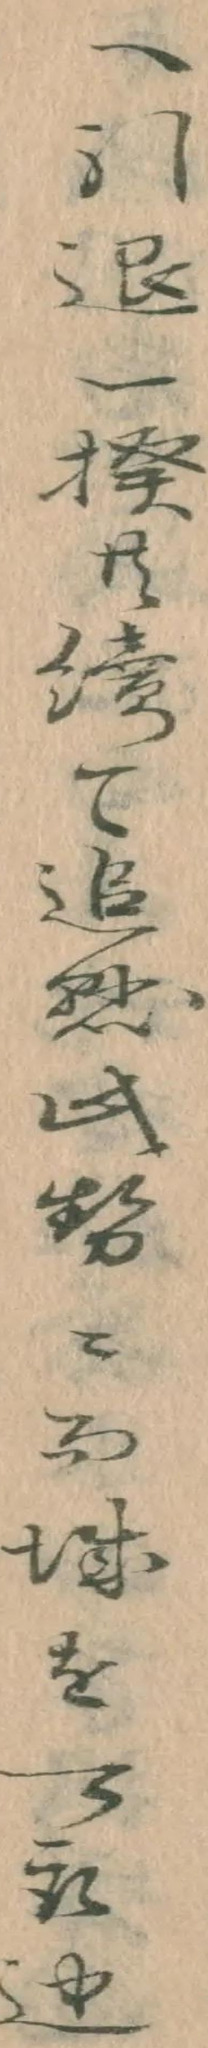へ引退一揆共続て追懸此勢に而城を可取迚
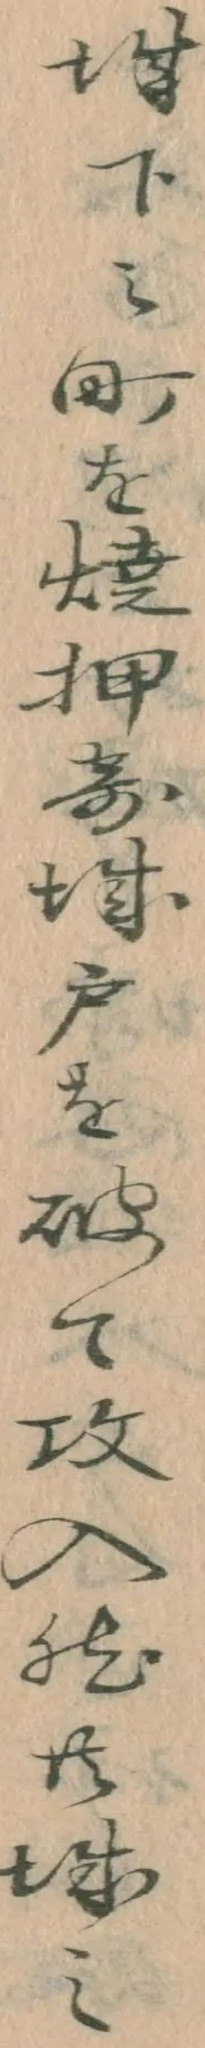城下之町を焼押寄城戸を破て攻入然共城之
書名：切支丹御退治記 49巻. [1]
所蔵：国立国会図書館 National Diet Library, JAPAN
